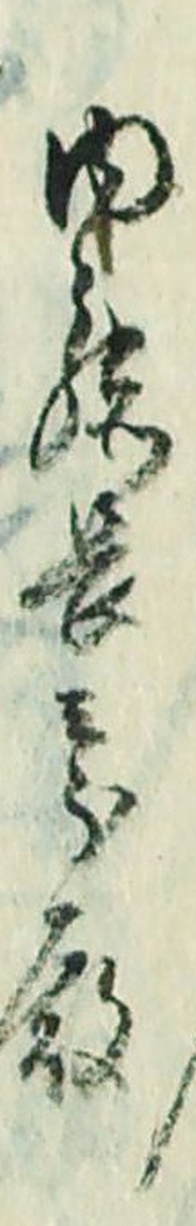内藤長三郎殿
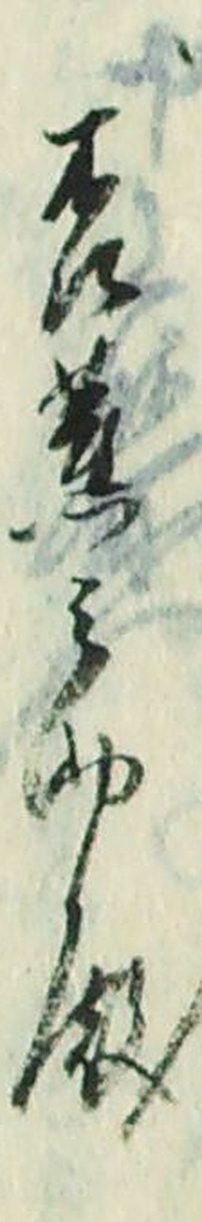森薫之助殿
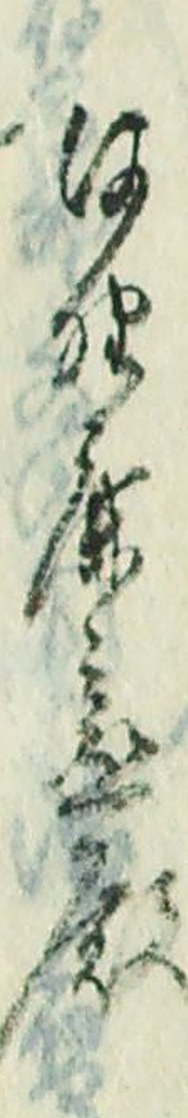河野鹿之丞殿

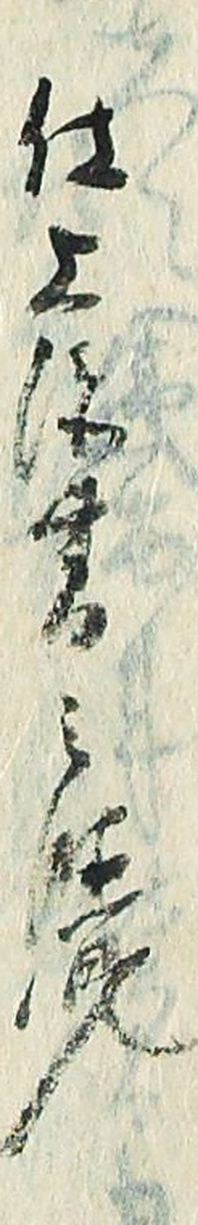仕上添書之覚
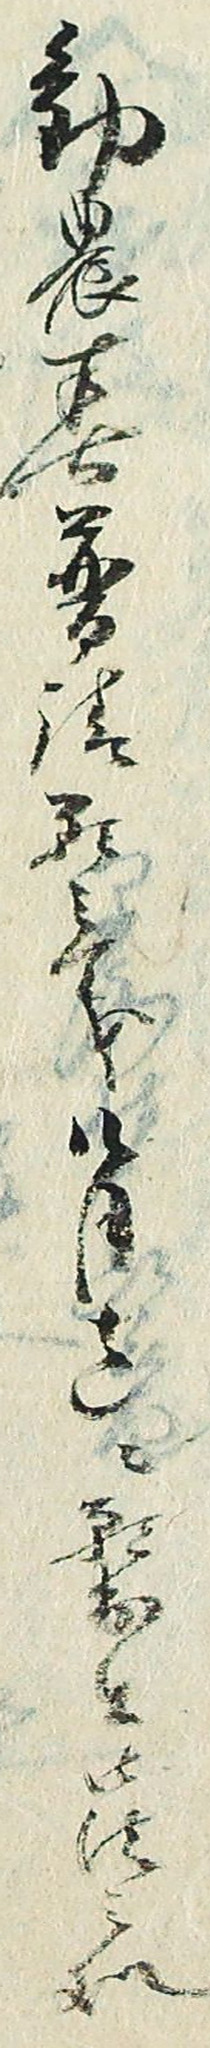勧農春普請願之義八月迄に願出候御法之処
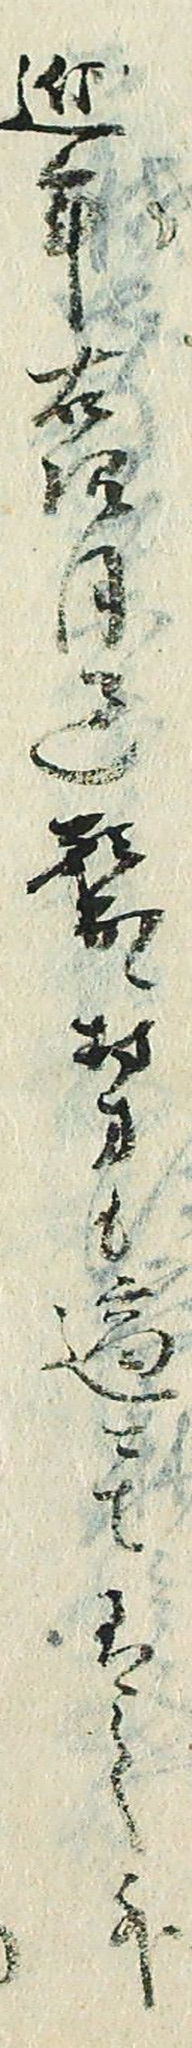近年右限月過願出候村方も適には有之外
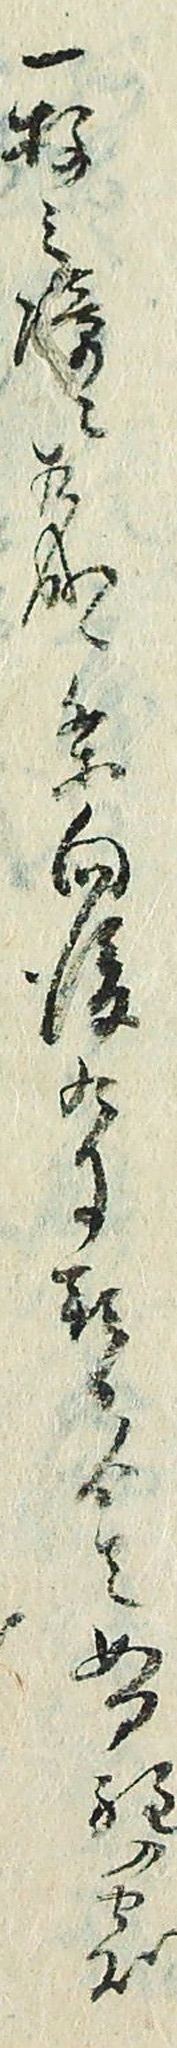一牧之障に相成候条向後九月朔日ゟは如何程入判
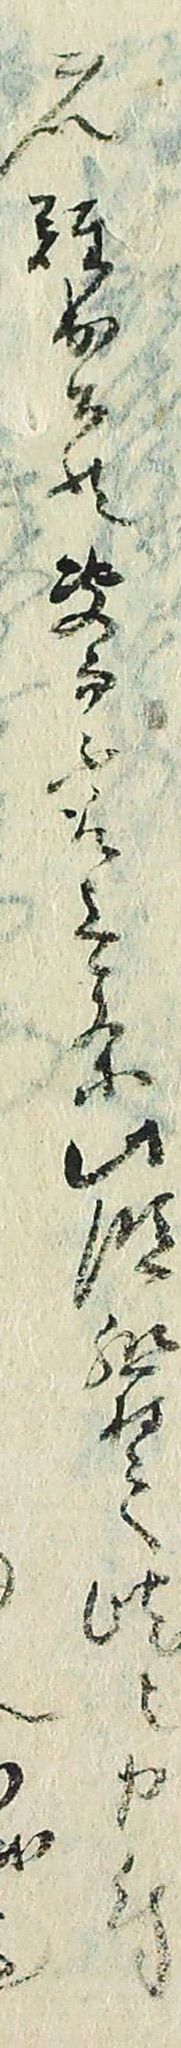を以難出候共決而不取上候条此段組村々へ屹と申付
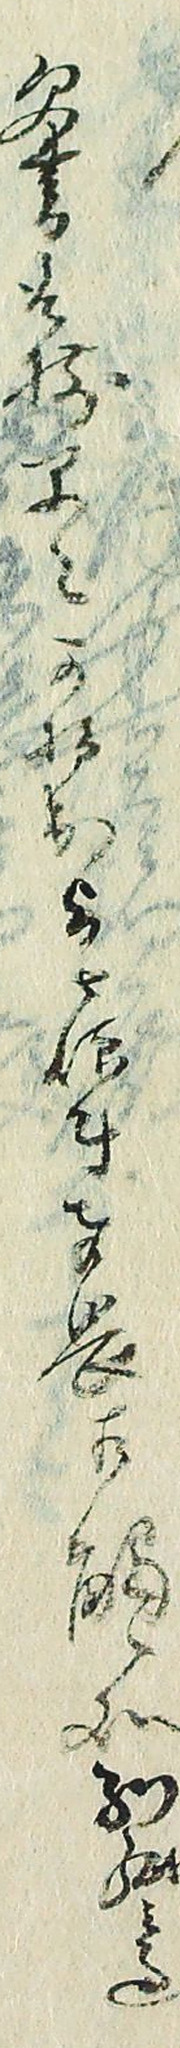受書取揃早々可指出旨被仰付奉畏相触候処別紙之通
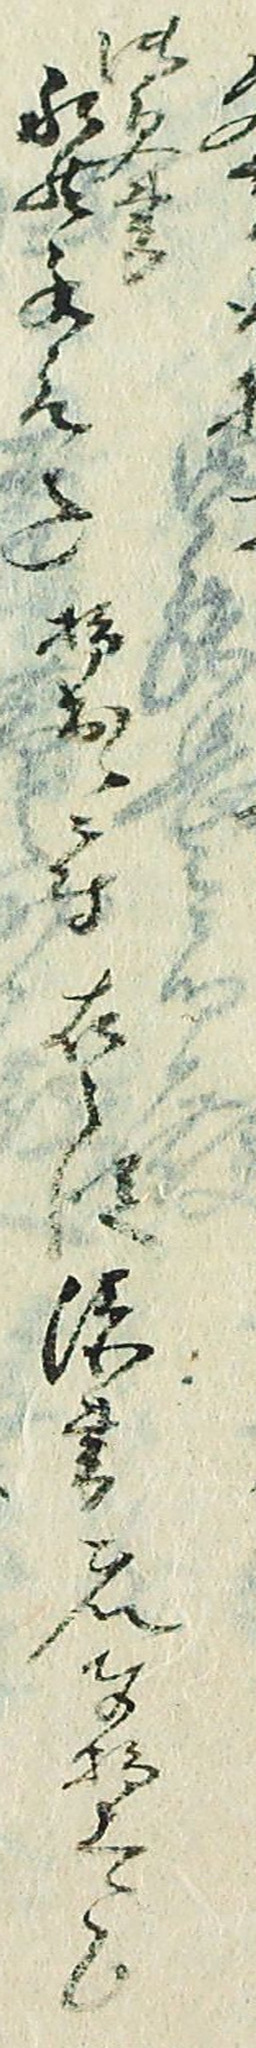御受書私共手元迄指出候に付右之段添書を以奉指上候以上
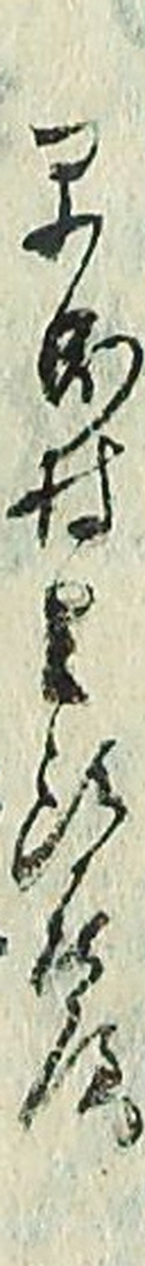早渕村与頭庄屋
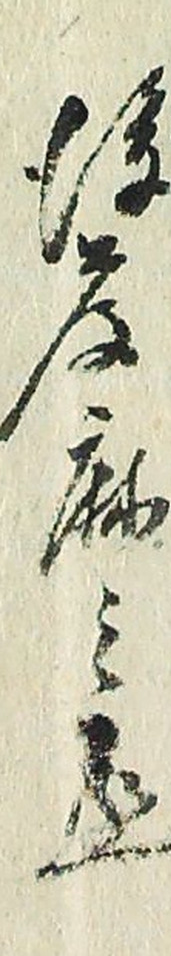後藤麻之丞
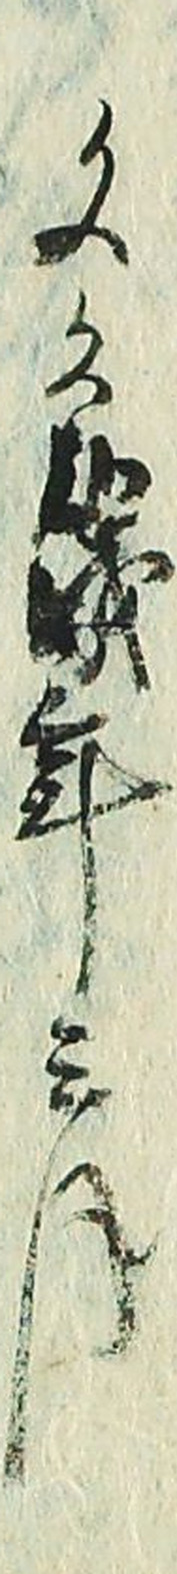文久弐戌年三月
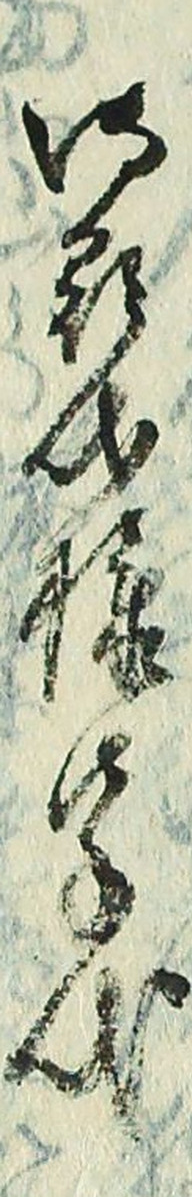御郡代様御手代
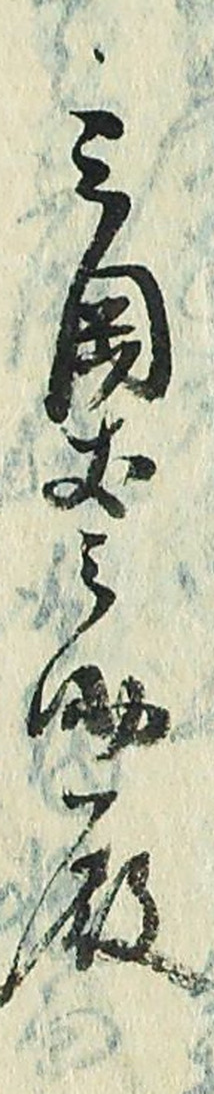三岡丈之助殿
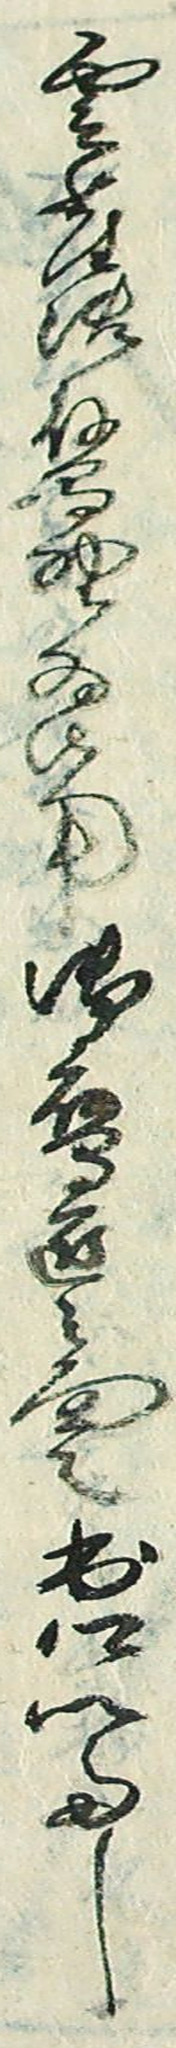雲雀御鷹野為御用御鷹匠之面々出郷いたし
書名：諸御用御□受書控
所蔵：鳴門教育大学 Naruto University of Education
